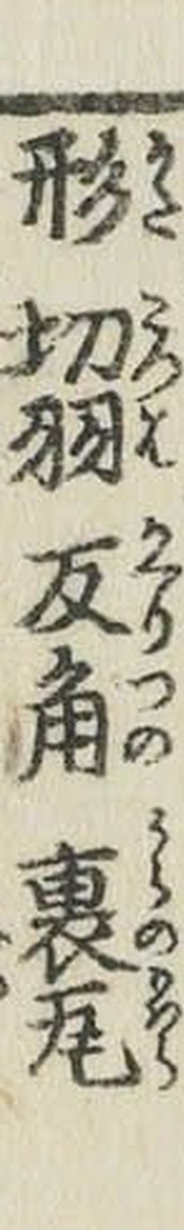形切羽反角裏瓦
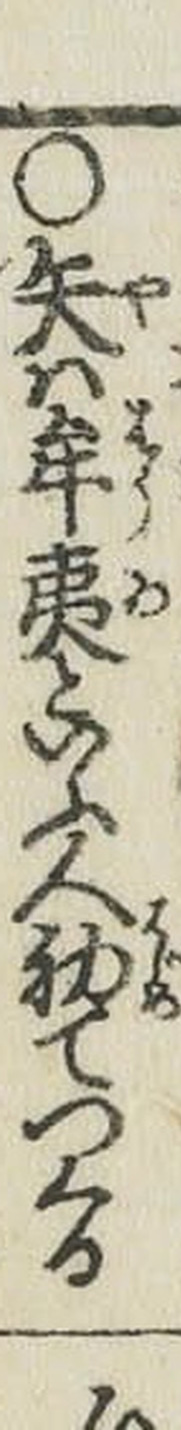○矢は牟夷といふ人初てつくる
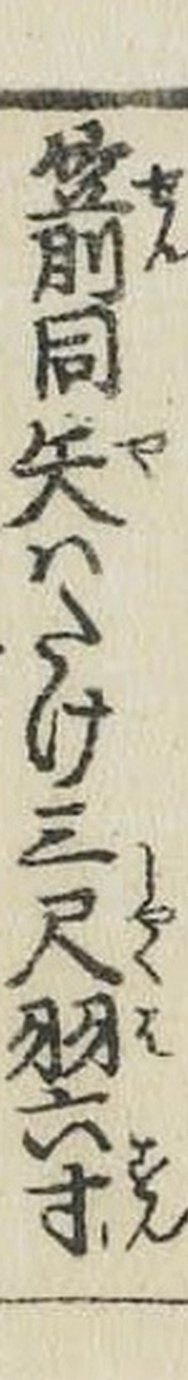箭同矢はたけ三尺羽六寸
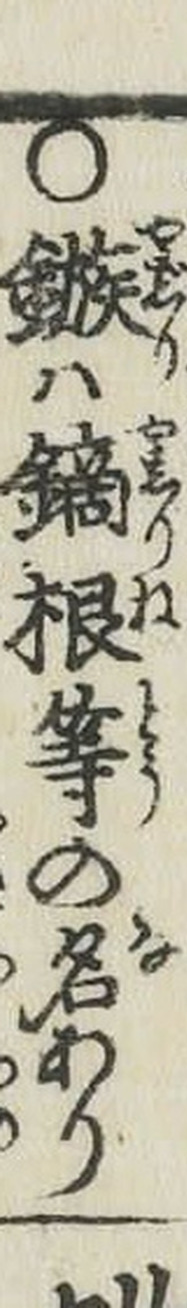○鏃は鏑根等の名あり
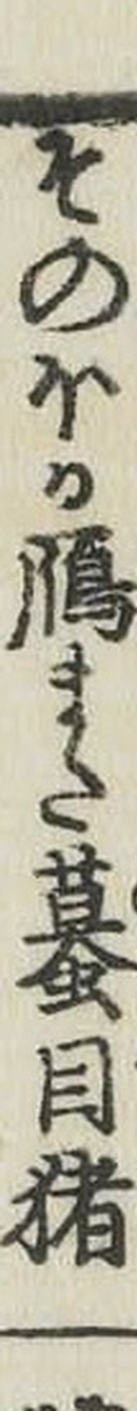そのほか鴈また蟇目猪
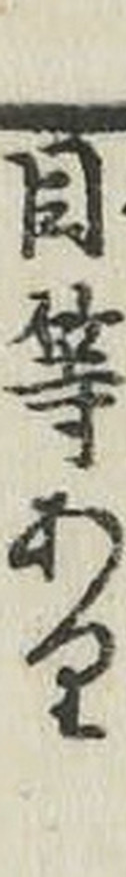目等あり
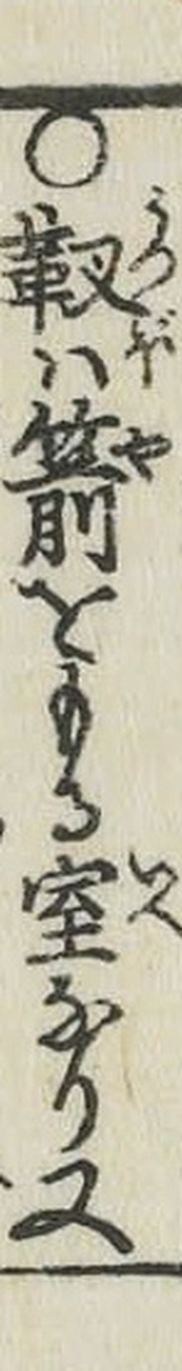○靫は箭をもる室なり又
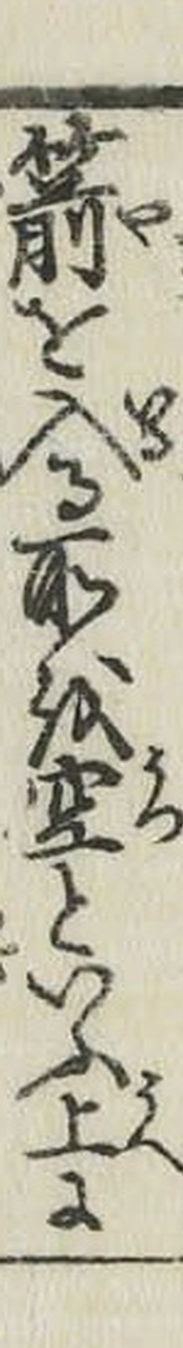箭を入る所を空といふ上に
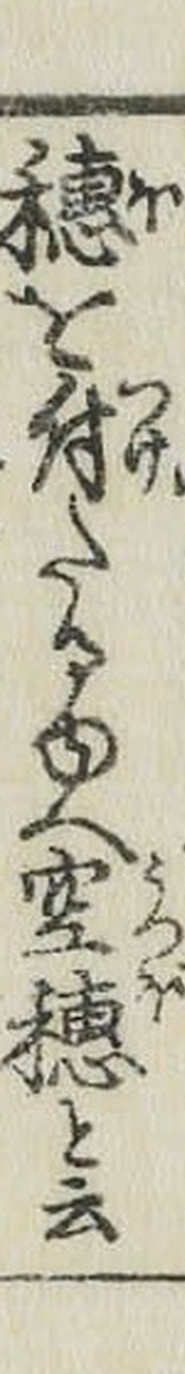穂を付たるゆへ空穂と云
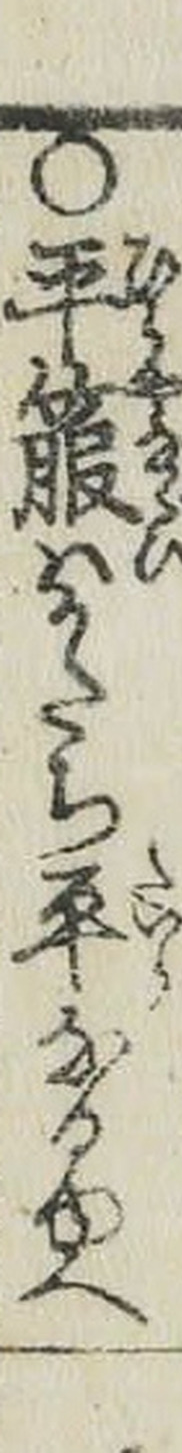○平箙はかたち平なるゆへ

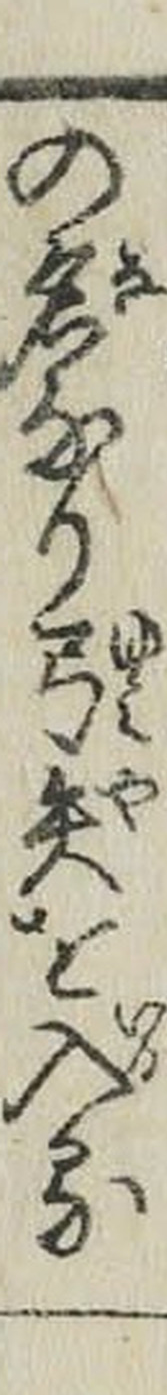の名なり弓矢を入る
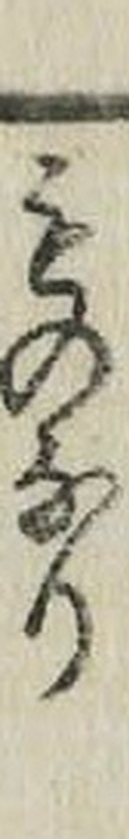ものなり
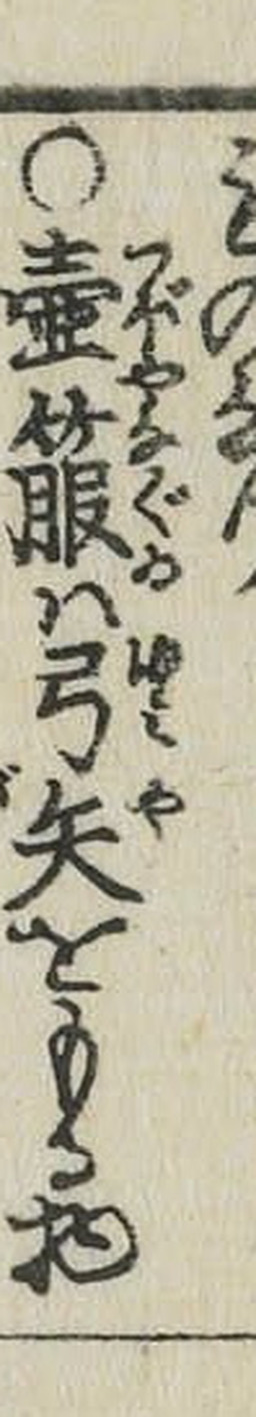○壺箙は弓矢をもる物
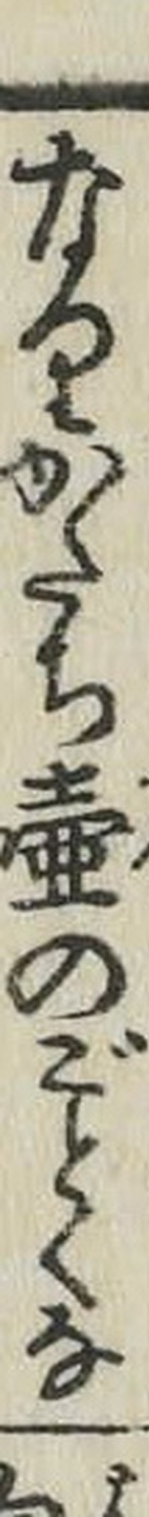なりかたち壺のごとくな
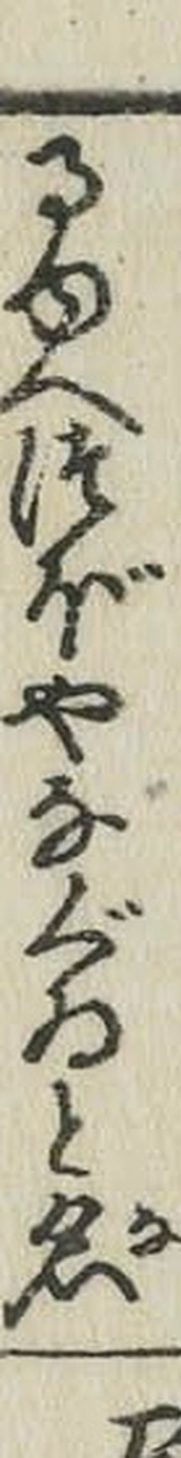るゆへつぼやなぐゐと名
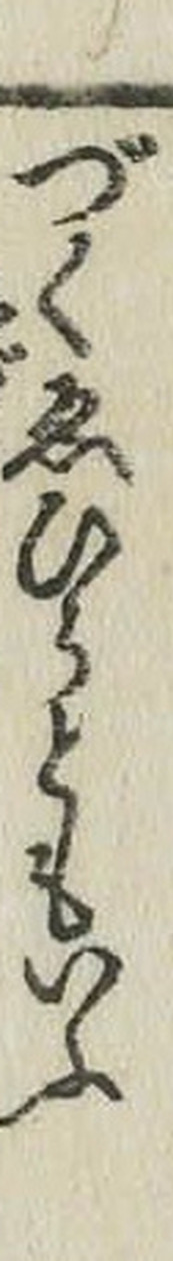づくゑひらともいふ
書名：増補頭書訓蒙図彙大成 10巻 5:巻之9-11
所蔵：東京学芸大学教育コンテンツアーカイブ
